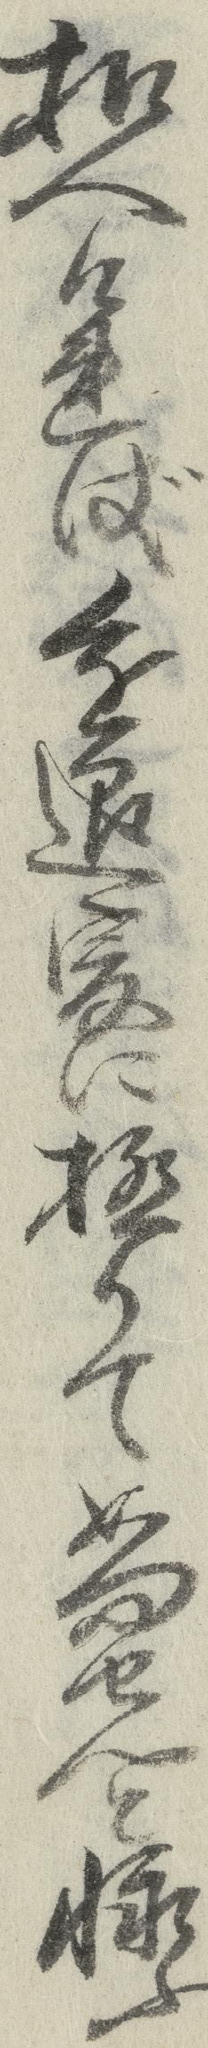扣へければ進退爰に極りて如何セんと様ふ
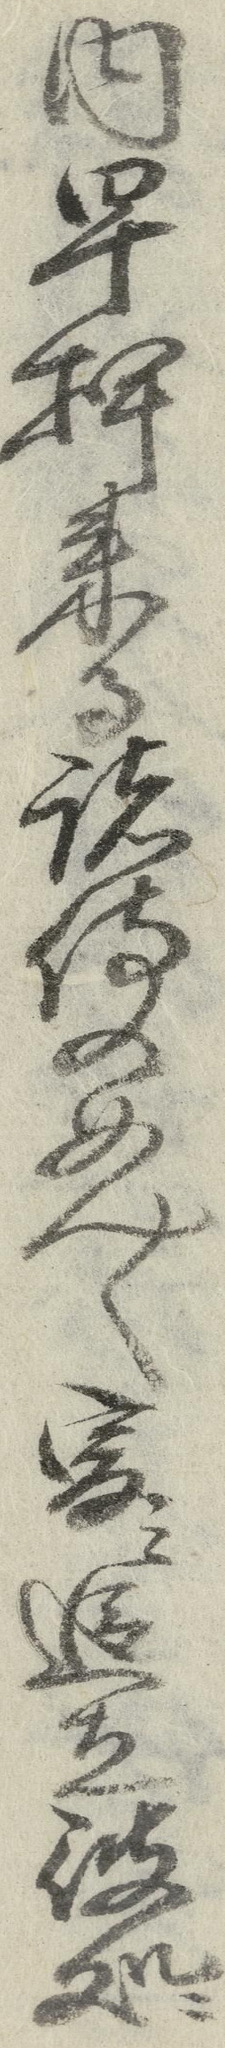内早押来る諸侍のめん〳〵爰に追立彼処に
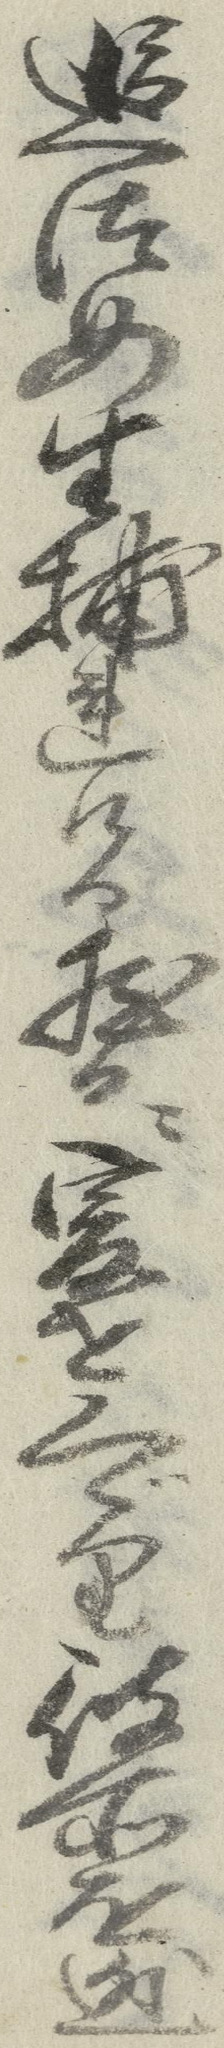追つめ生捕れける然るに爰をくゞり彼所を迯
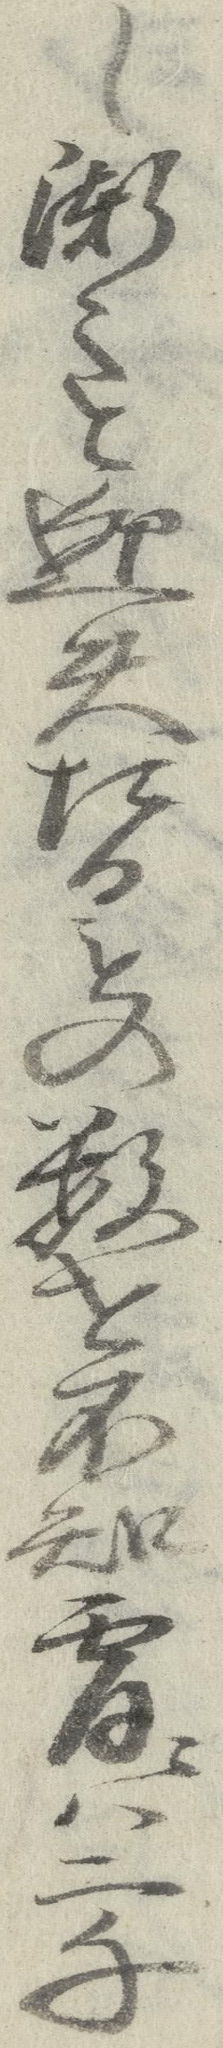し漸々と迯失たるもの数を不知宵には二千
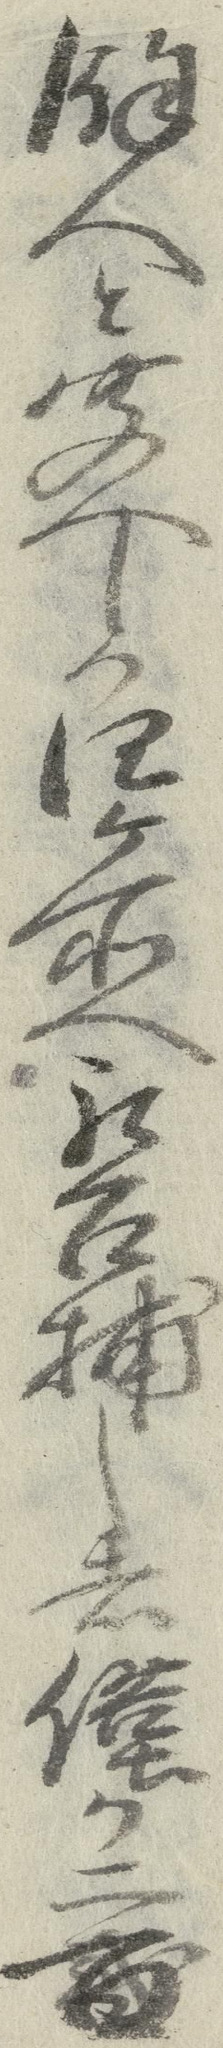餘人と聞へしか四ケ所へ被召捕し者僅か二百
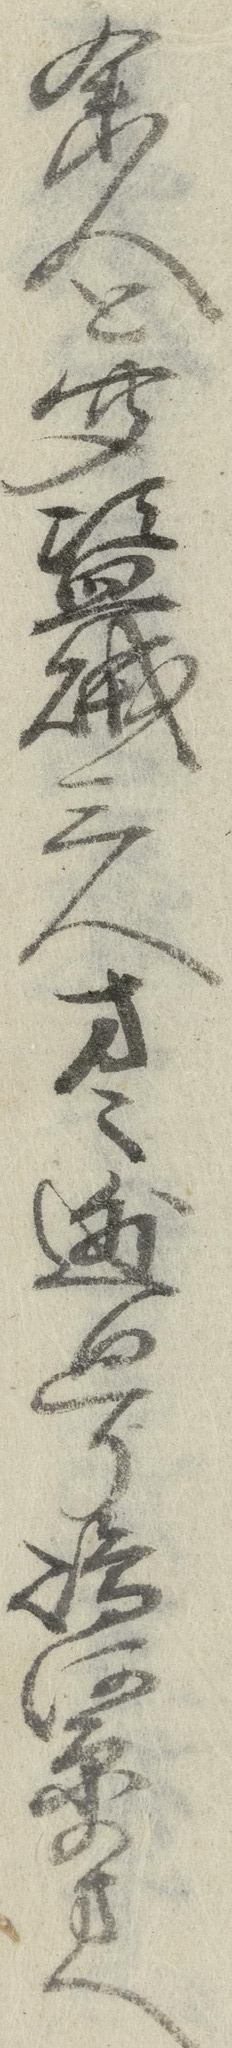余人と聞盗賊三人方々迯廻り嶋河原の方へ

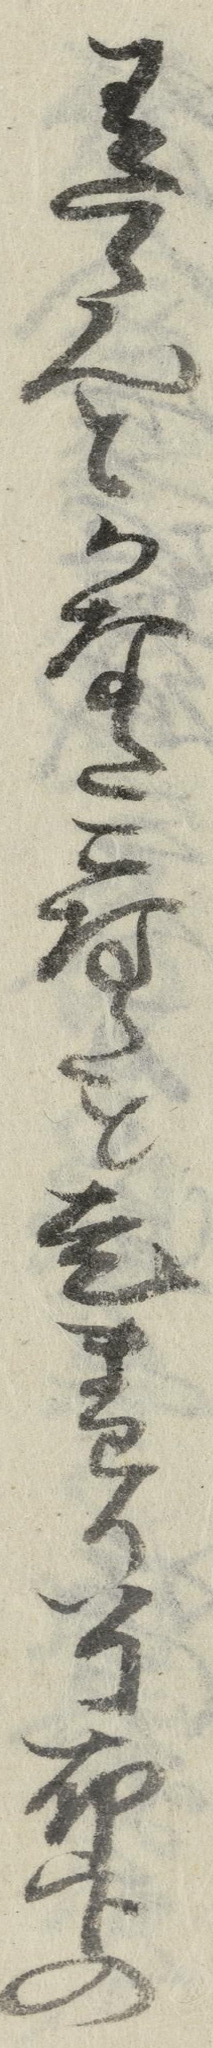わたらんとかなたこなたと走まわり足布下の
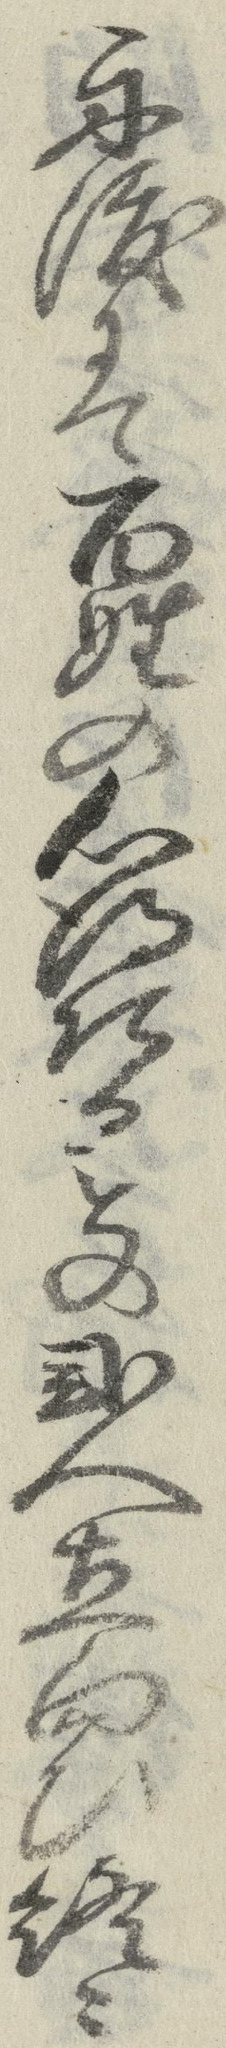舟渡にて百姓の心得たるもの弐人立向ひ終に
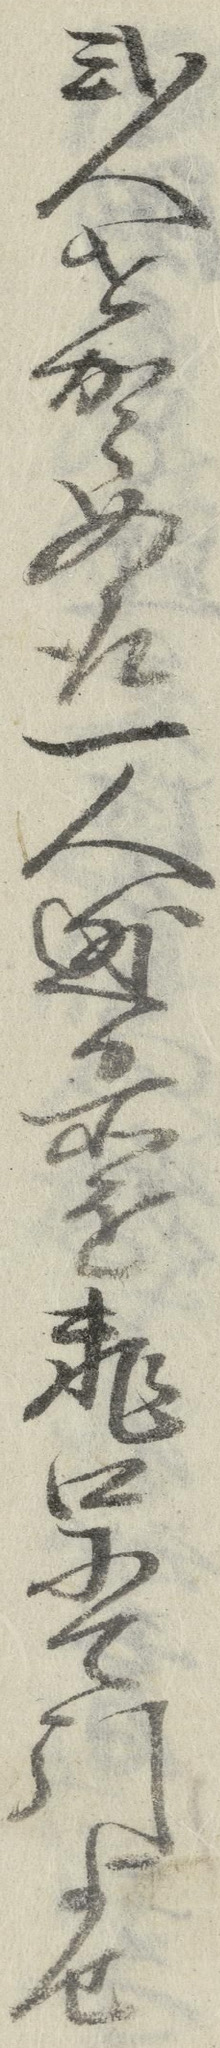弐人をからめ取一人迯る所を飛口にて引よせ
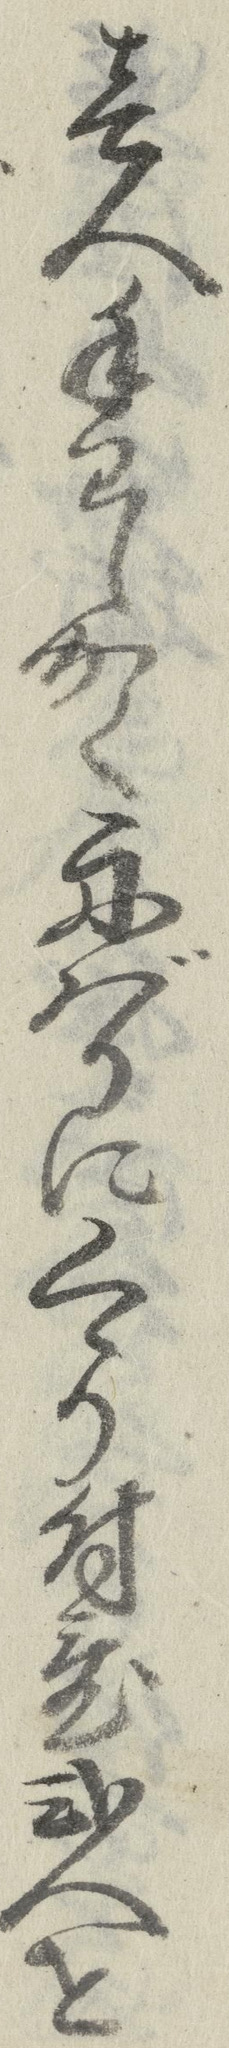壱人手わし如く舟ばりにくゝり付置弐人を
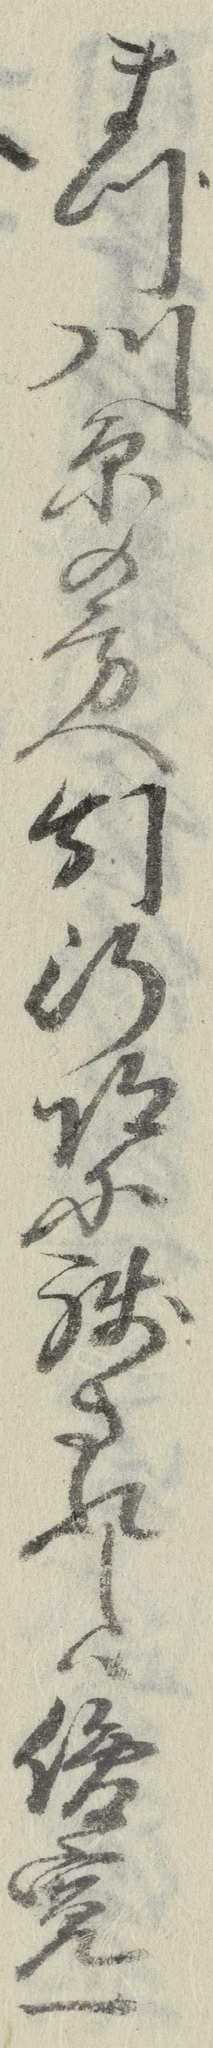まづ川原の方へ引行跡に残されしは俊寛一
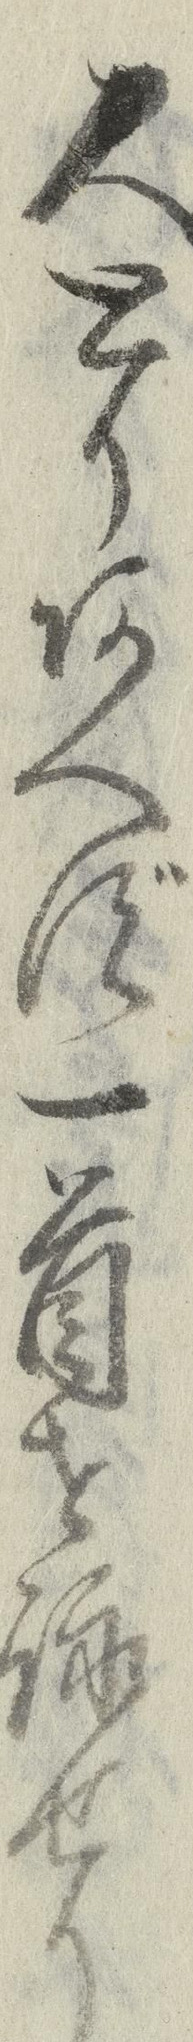人とりあへず一首を詠せり
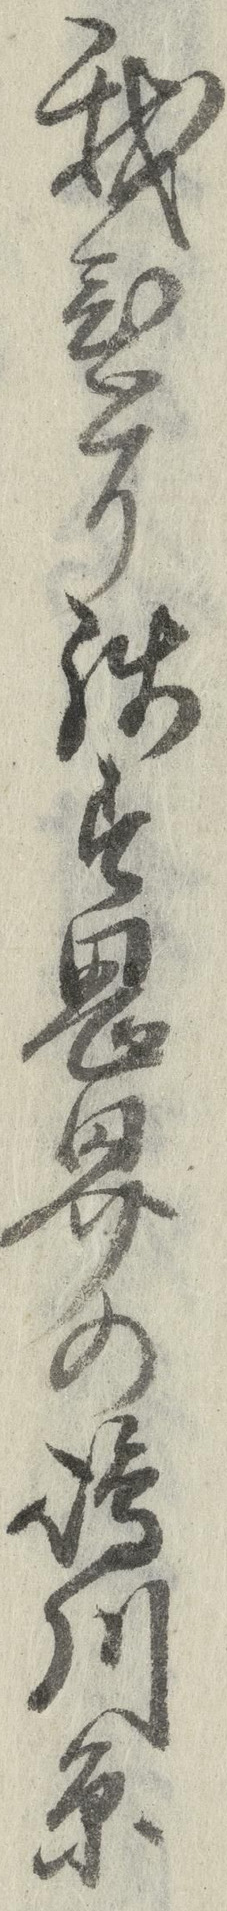我ひとり残す鬼界の嶋河原
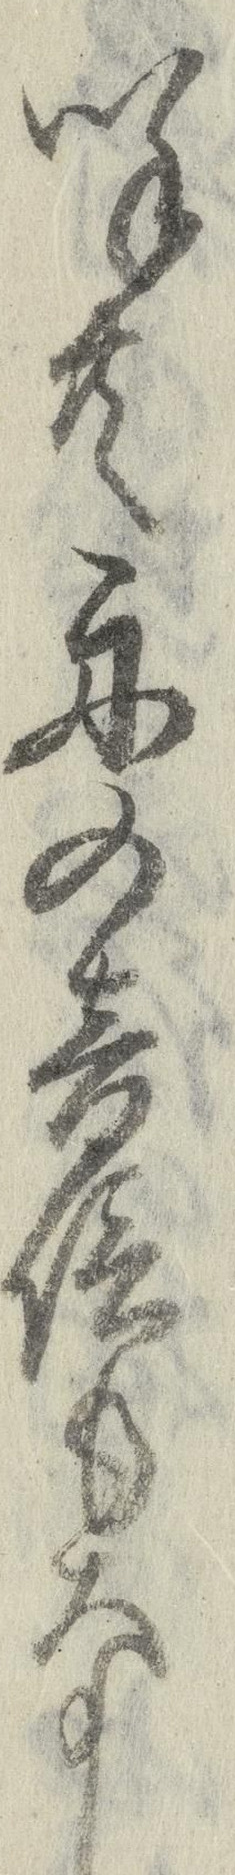呼共舟の音信もなし
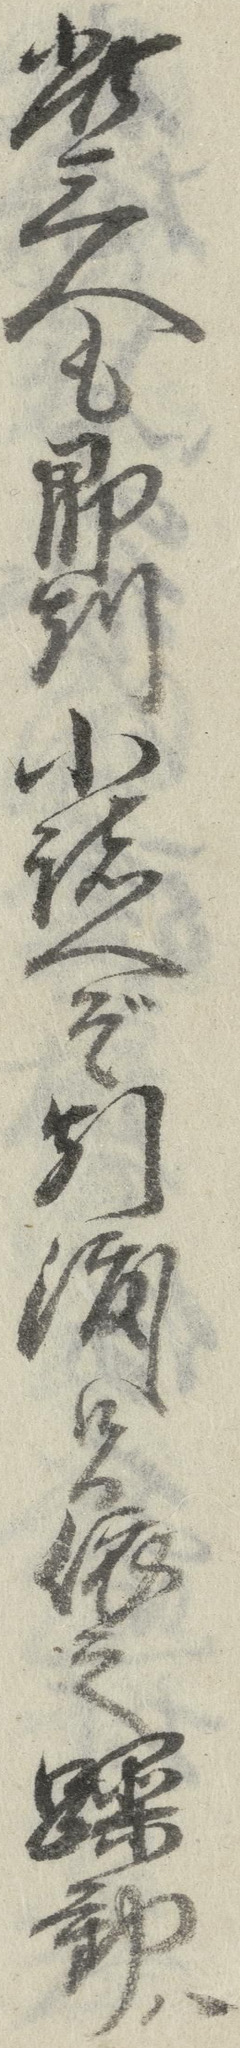此三人も即刻小諸へぞ引渡ける依之躁動は
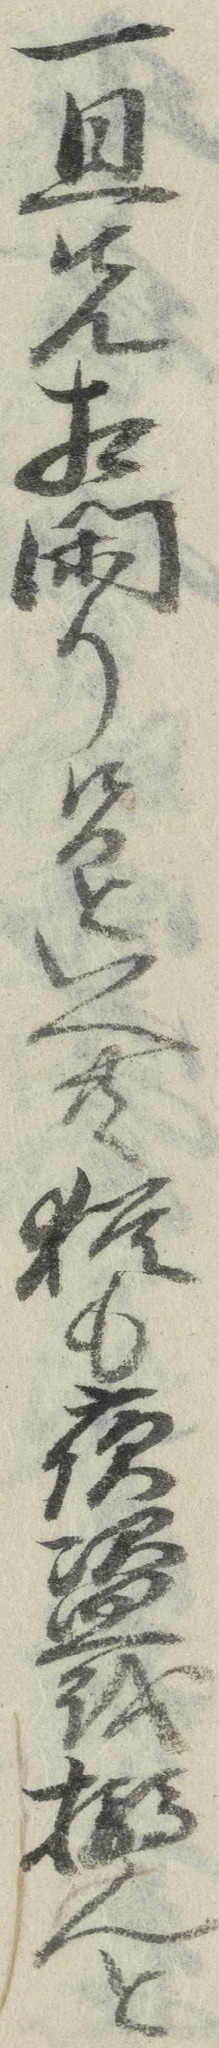一旦先相閑りけるといへ共猶も夜盗を搦んと
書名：浅間大焼騒動記　下
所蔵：東京大学地震研究所図書室 Earthquake Research Institute Library, The University of Tokyo, JAPAN
